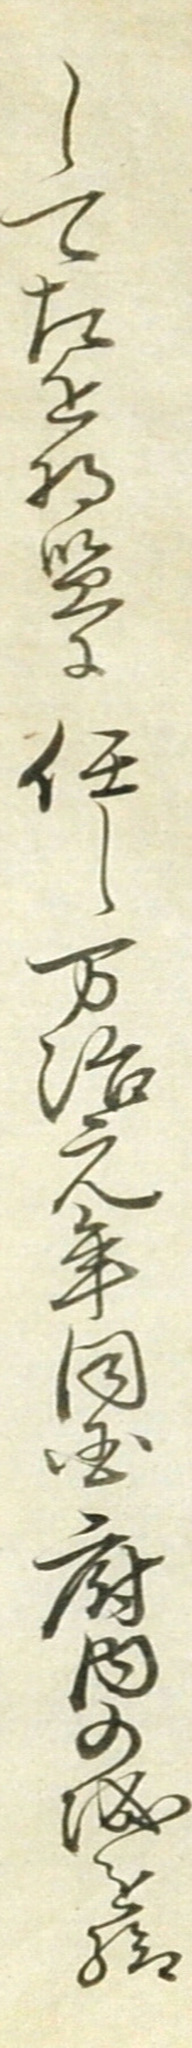して左近将監に任し万治元年同国府内の城を給
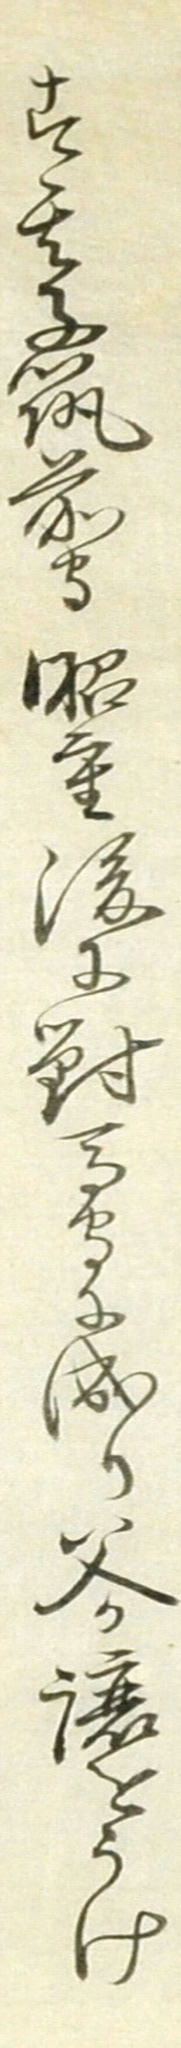す其子筑前守昭重後に対馬守に成り父か譲をうけ
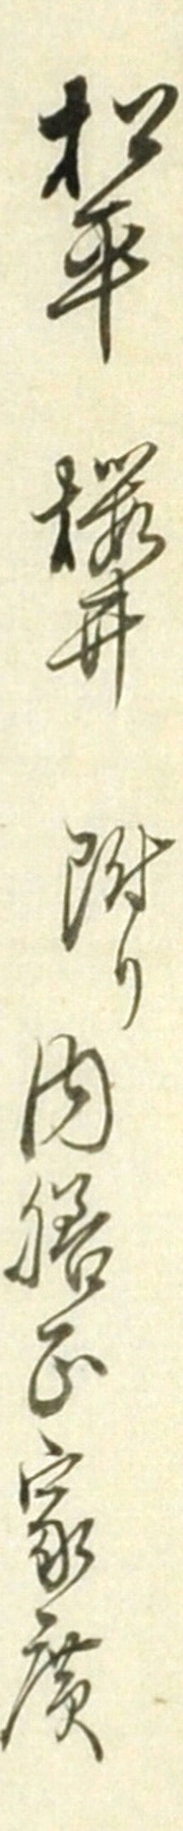松平桜井付り内膳正家廣
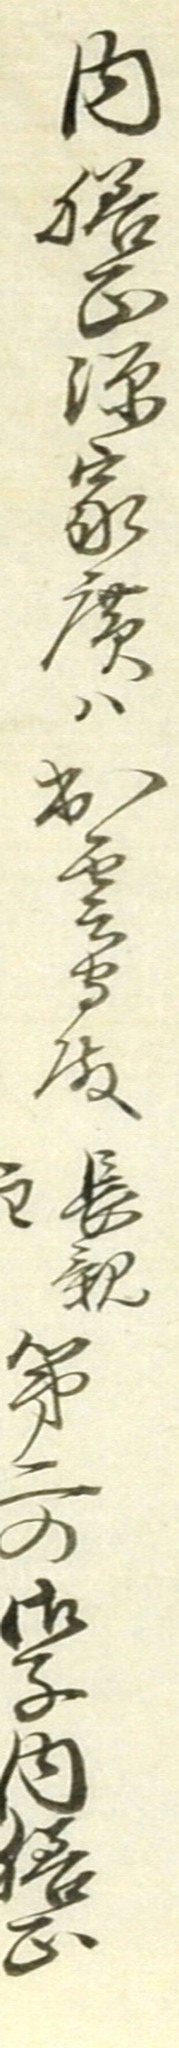内膳正源家廣は出雲守殿長親主第二の御子内膳正
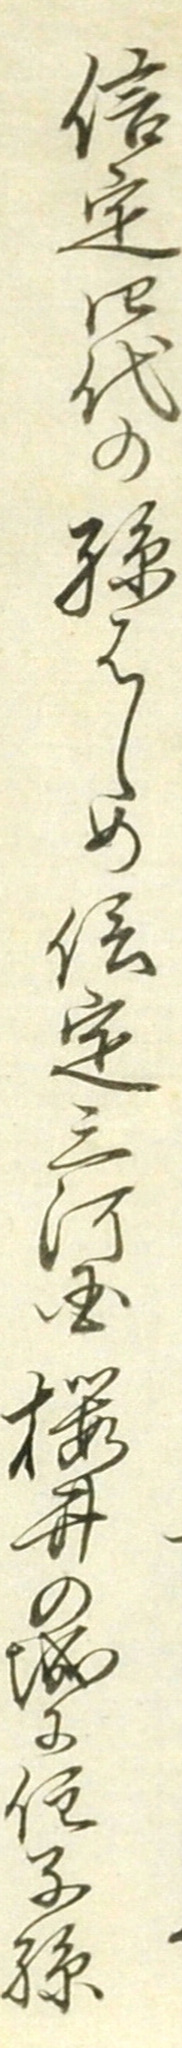信定四代の孫はしめ信定三河国桜井の城に住子孫
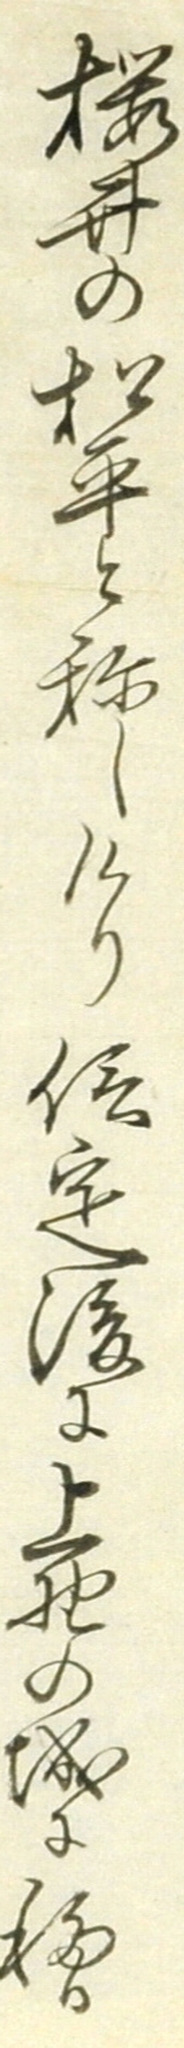桜井の松平と称しけり信定後に上野の城に移る
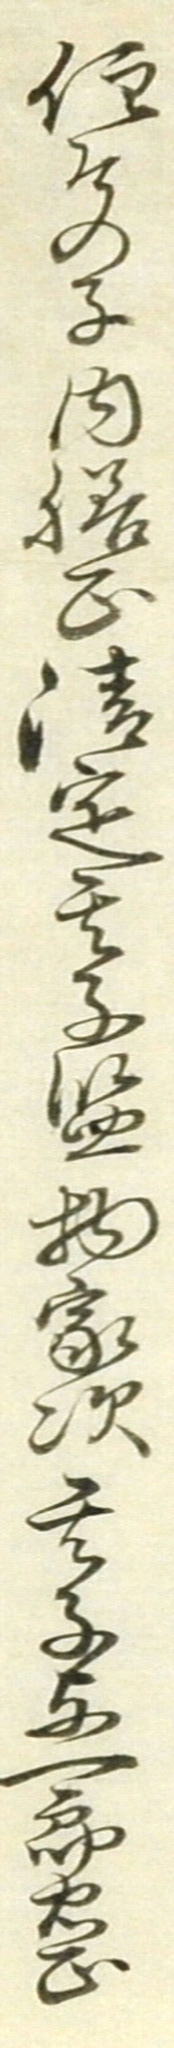住その子内膳正清定其子監物家次其子与一郎忠正
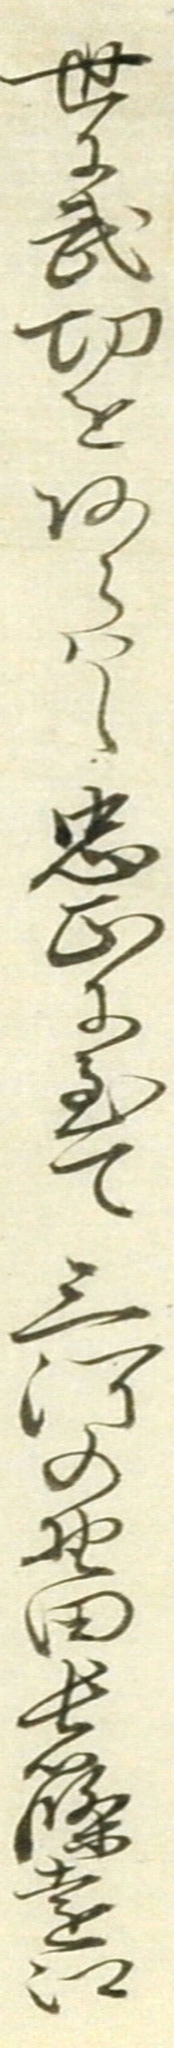世に武功をあらはし忠正に至て三河の野田長篠遠江
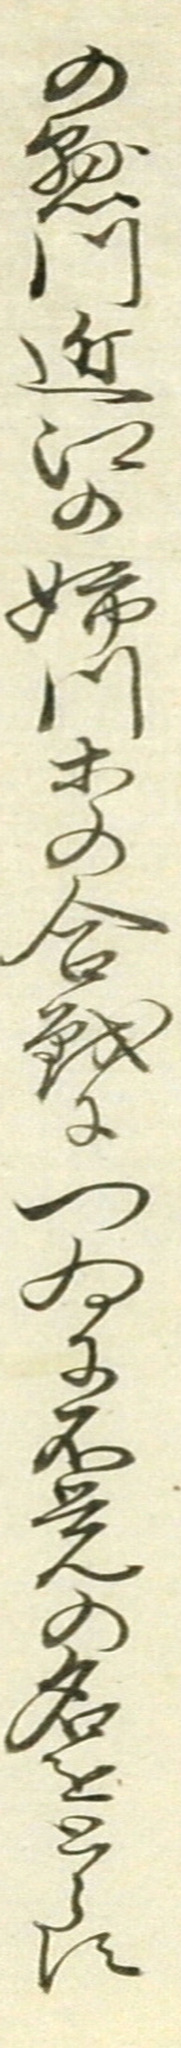の懸川近江の姉川等の合戦につゐに不覚の名をとらす
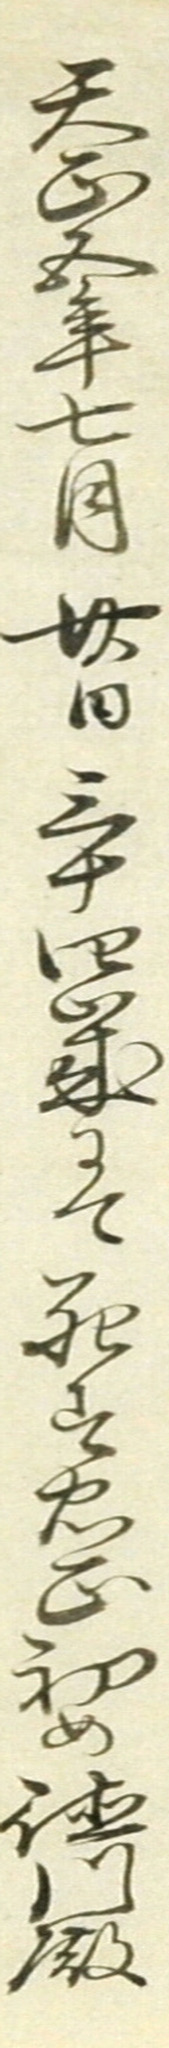天正五年七月廿日三十四歳にて死す忠正初め徳川殿
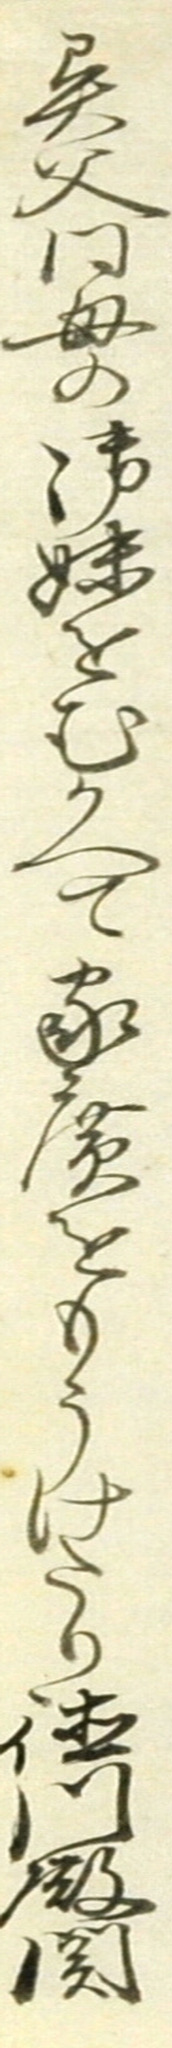異父同母の御妹をむかへて家廣をもうけたり徳川殿関
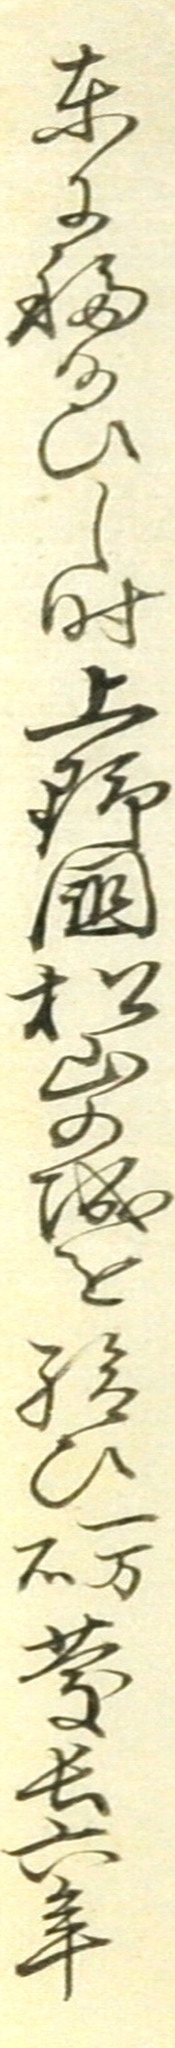東に移給ひし時上野国松山の城を給ひ一万石慶長六年

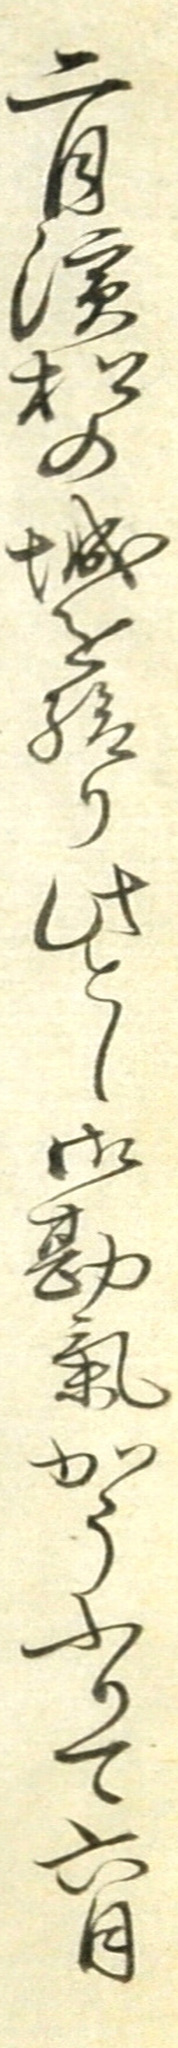二月浜松の城を給り此とし御勘気かうふりて六月
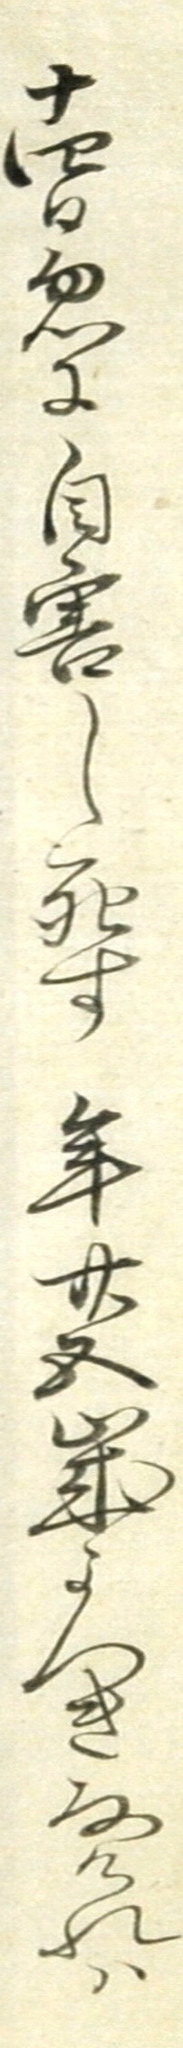十四日忽に自害し死す年二十五歳よつきなけれは
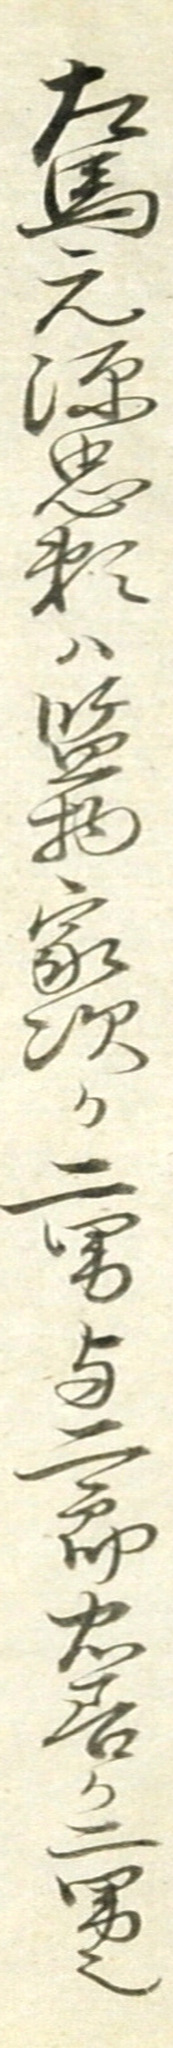左馬允源忠頼は監物家次か二男与二郎忠善か二男也
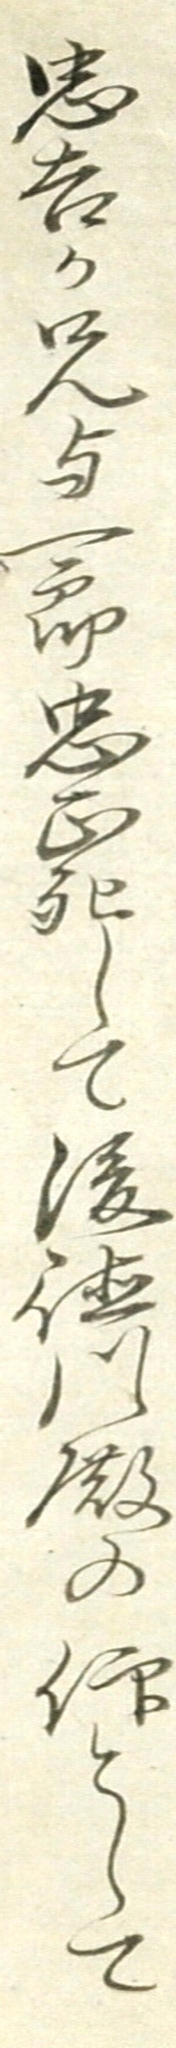忠吉か兄与一郎忠正死して後徳川殿の仰として
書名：藩翰譜（二・三）
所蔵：伊那市立高遠町図書館・合同会社AMANE
